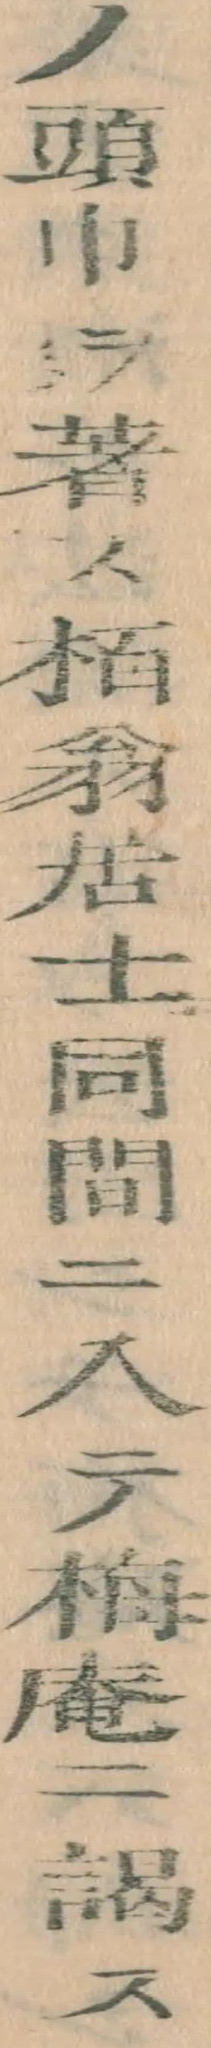ノ頭巾ヲ著ス栢翁居士同間ニ入テ梅庵ニ謁ス
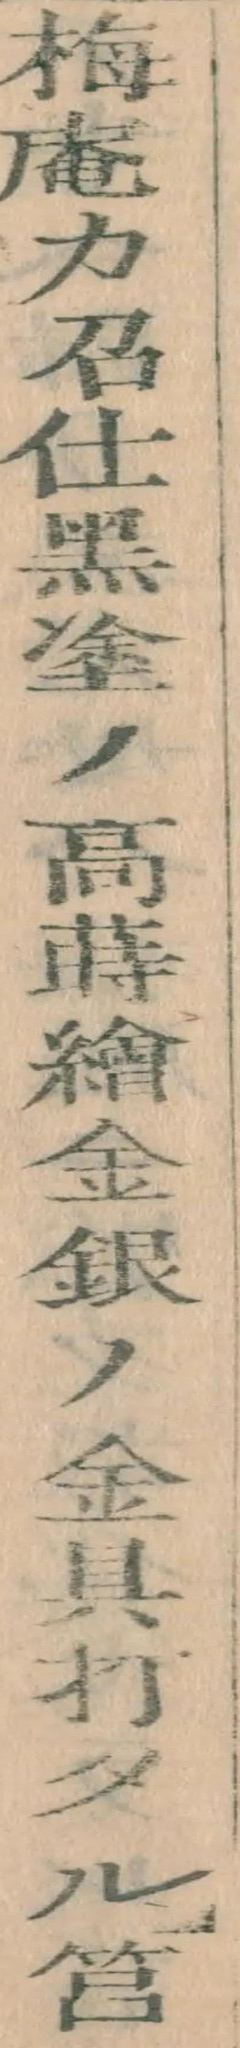梅庵カ召仕墨塗ノ高蒔絵金銀ノ金具打タル筥
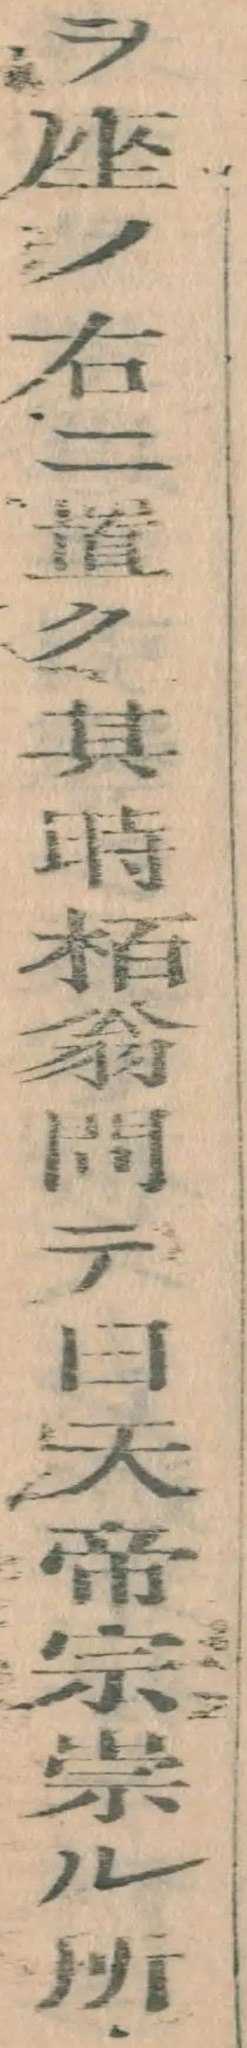ヲ座ノ右ニ置ク其時栢翁問テ曰天帝宗崇ル所
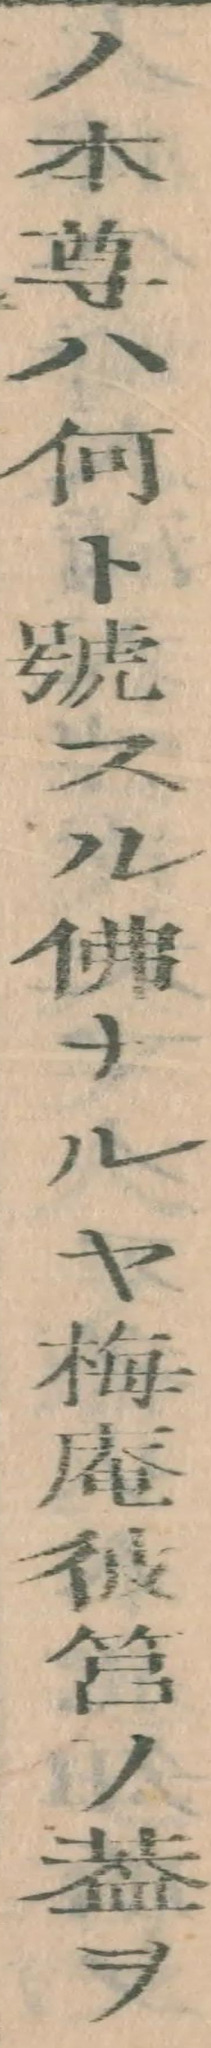ノ本尊ハ何ト号スル仏ナルヤ梅庵彼筥ノ蓋ヲ
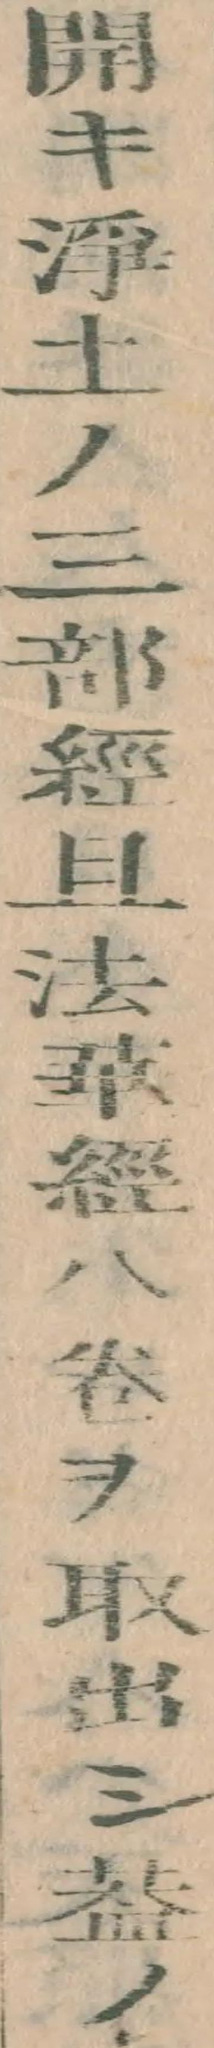開キ浄土ノ三部経且法華経八巻ヲ取出シ蓋ノ
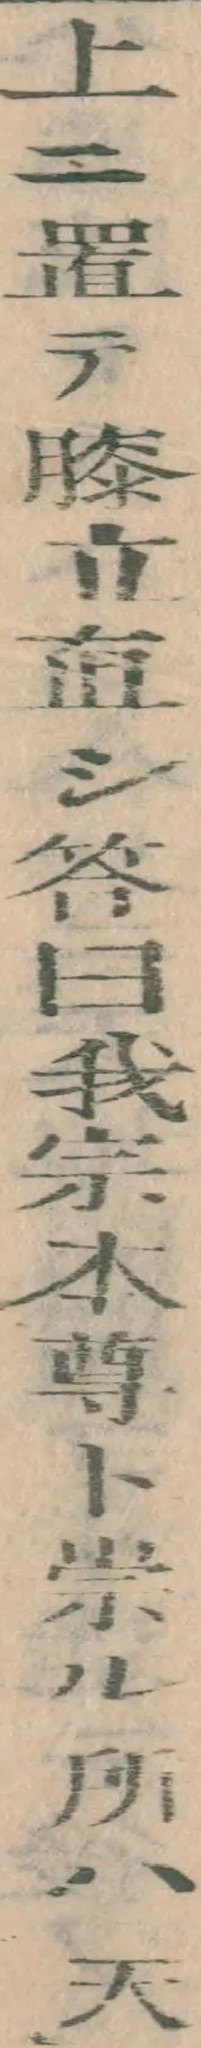上ニ置テ膝立直シ答曰我宗本尊ト崇ル所ハ天
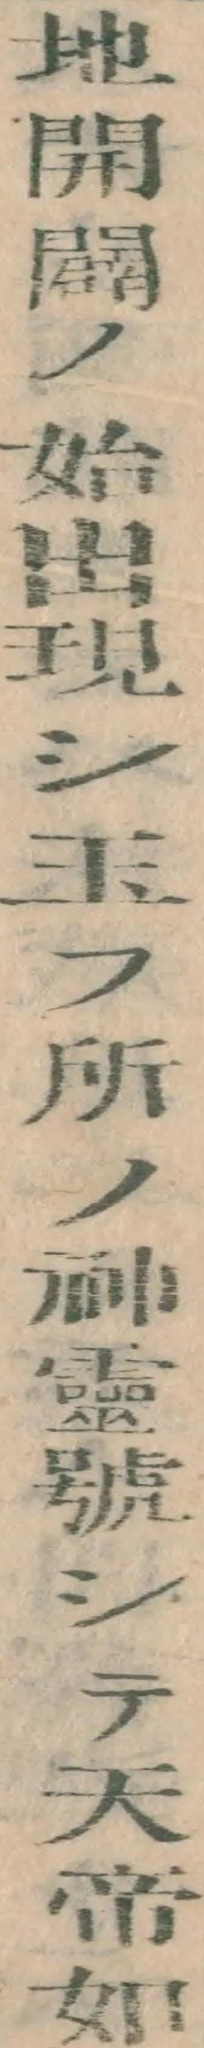地開闢ノ始出現シ玉フ所ノ神霊号シテ天帝如
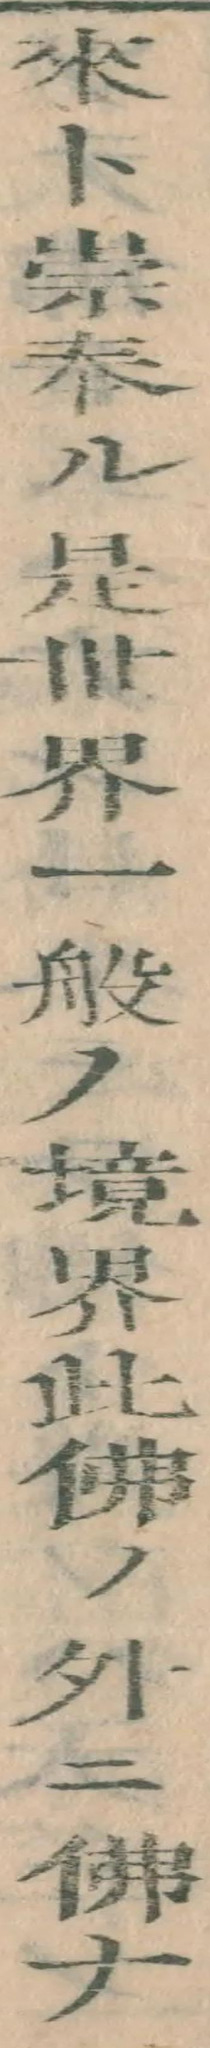来ト崇奉ル是世界一般ノ境界此仏ノ外ニ仏ナ
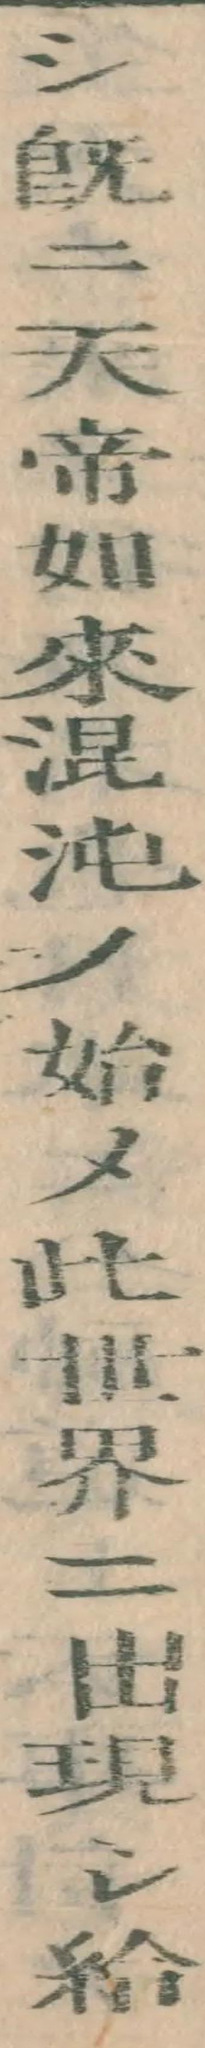シ既ニ天帝如来混沌ノ始メ此世界ニ出現シ給
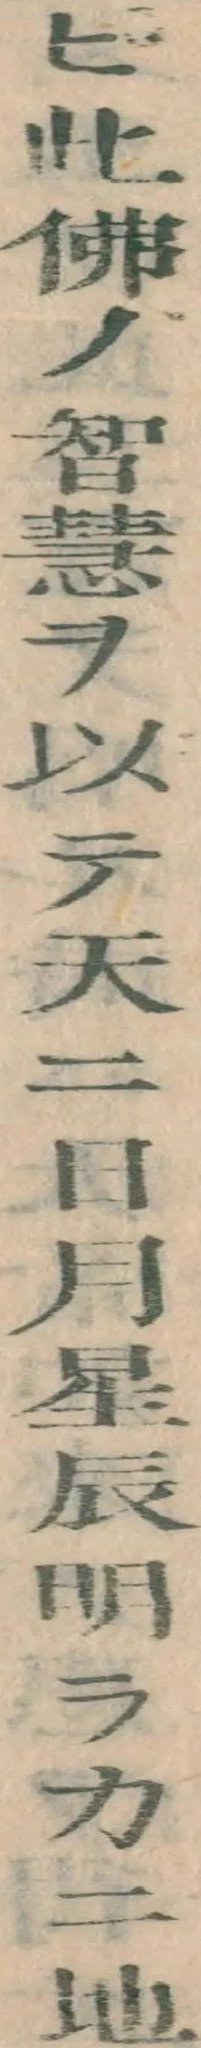ヒ此仏ノ智慧ヲ以テ天ニ日月星辰明ラカニ地
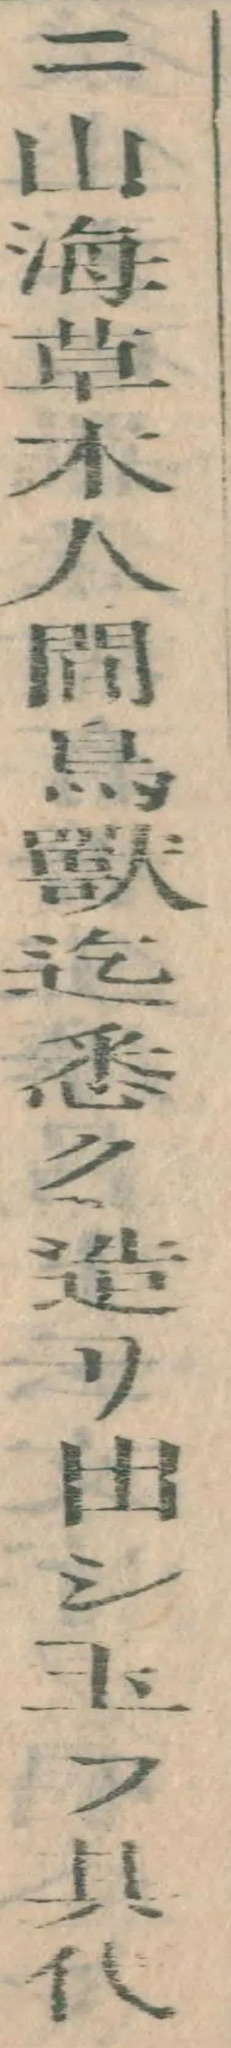ニ山海草木人間鳥獣迄悉ク造リ出シ玉フ其代
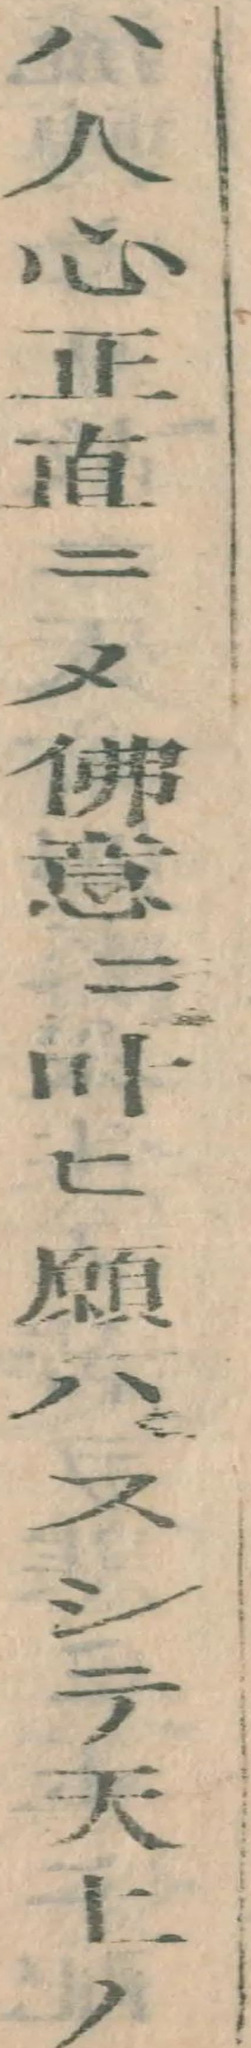ハ人心正直ニシテ仏意ニ叶ヒ願ハスシテ天上ノ
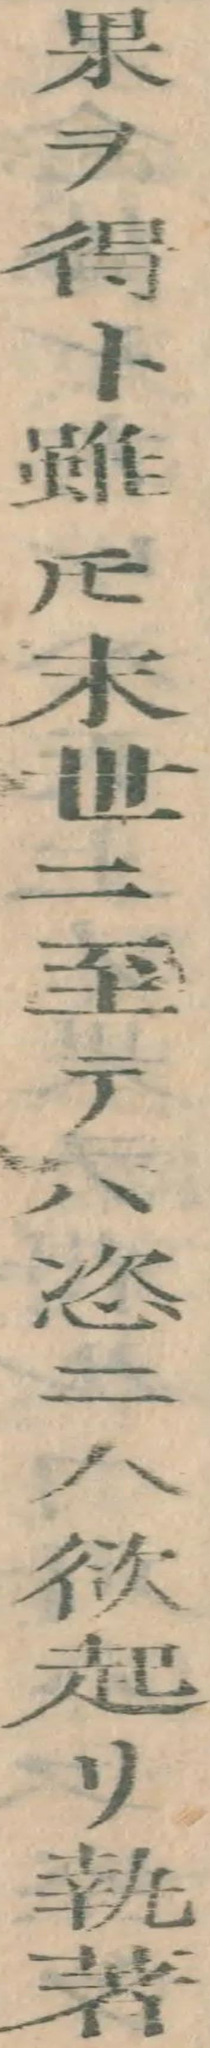果ヲ得ト雖トモ末世ニ至テハ恣ニ人欲起リ執著

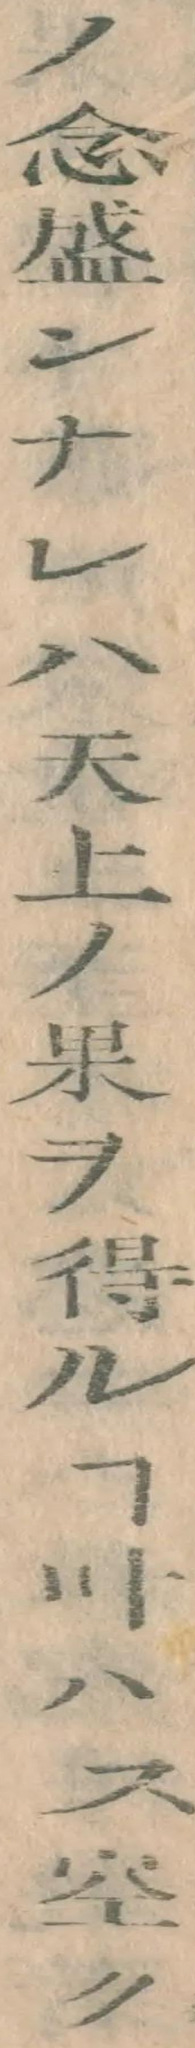ノ念盛ンナレハ天上ノ果ヲ得ルヿ叶ハス空ク
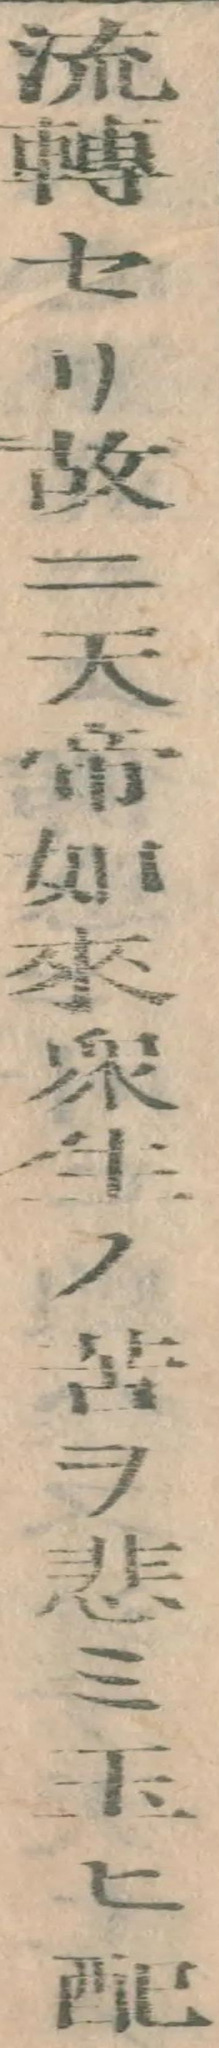流転セリ故ニ天帝如来衆生ノ苦ヲ悲ミ玉ヒ配
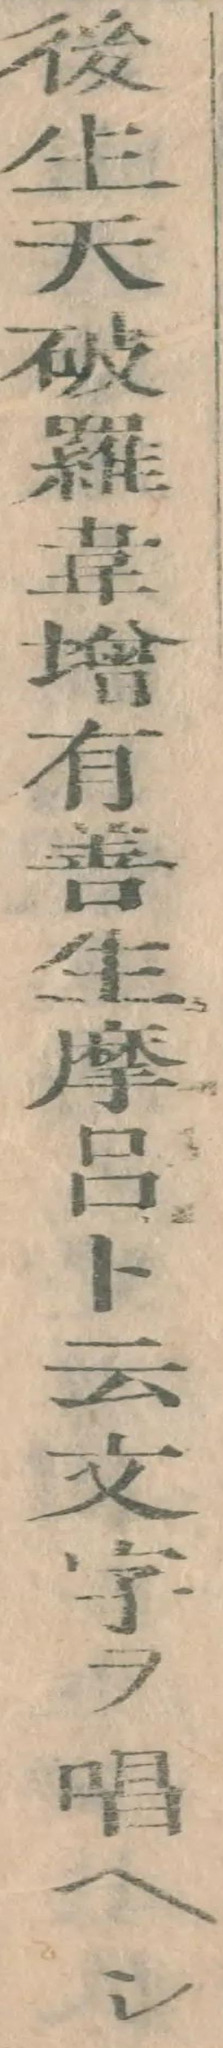後生天破羅韋増有善生摩呂ト云文字ヲ唱ヘシ
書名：南蛮寺興廃記
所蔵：国立国会図書館 National Diet Library, JAPAN
